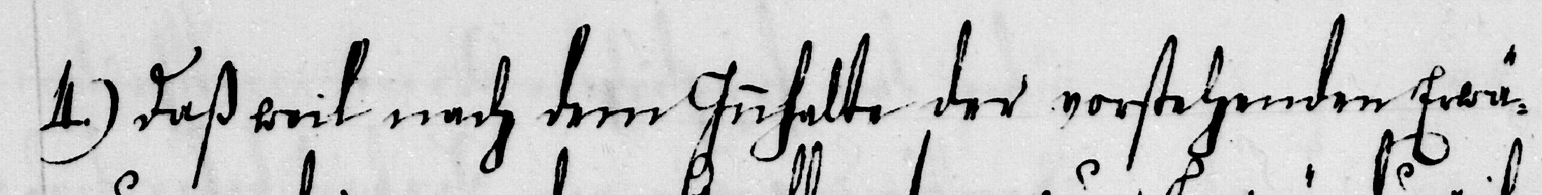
4.) Daß weil nach dem Innhalte der vorstehenden Erwä¬
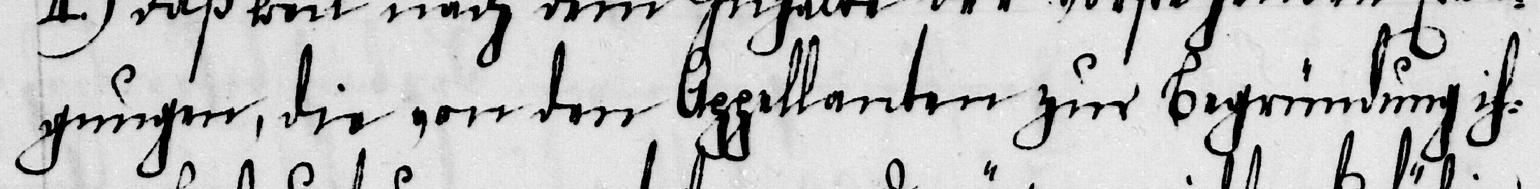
gungen, die von den Appellanten zur Begründung ih¬
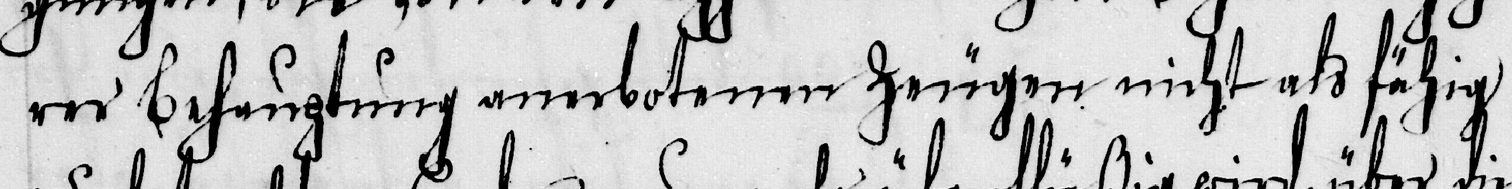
rer Behauptung anerbotenen Zeugen nicht als fähig
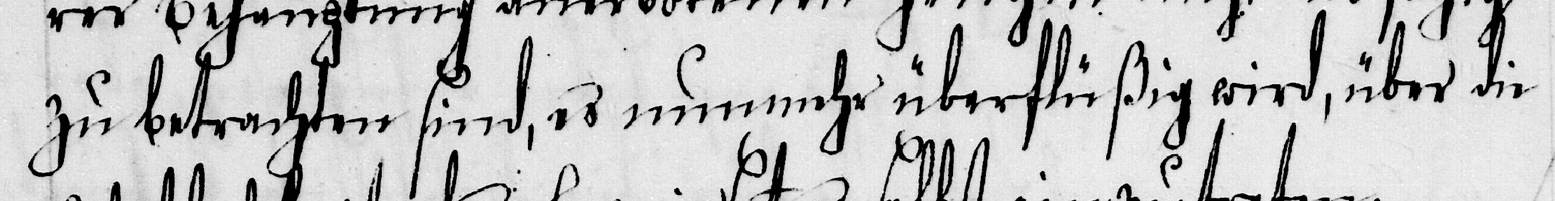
zu betrachten sind, es nunmehr überflüßig wird, über die
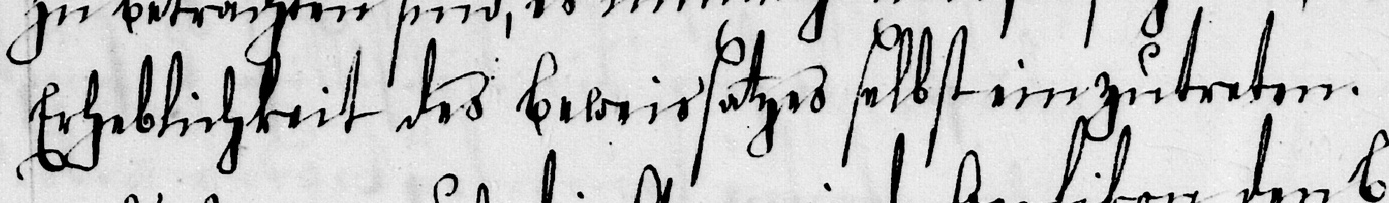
Erheblichkeit des Beweissatzes selbst einzutreten.
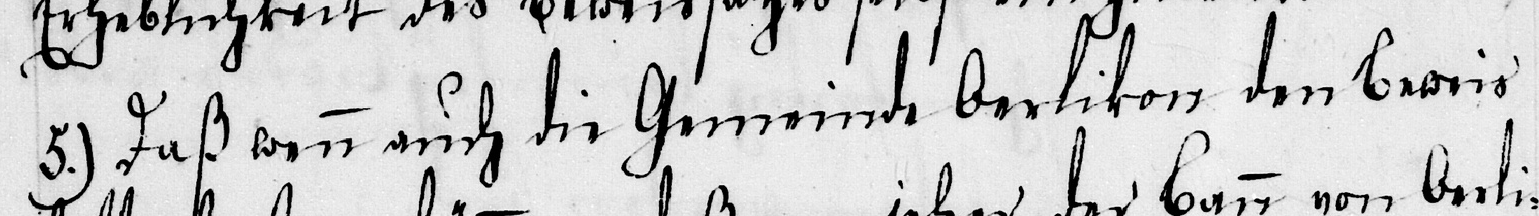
5.) Daß wenn auch die Gemeinde Oerlikon den Beweis
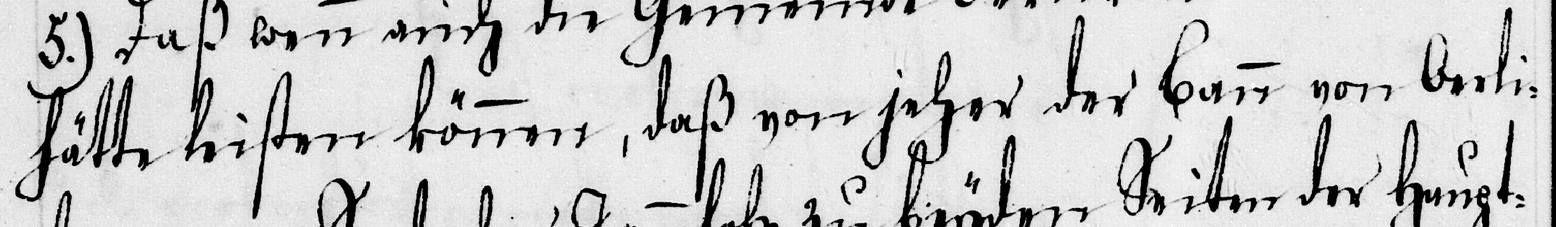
hätte leisten können, daß von jeher der Bann von Oerli¬
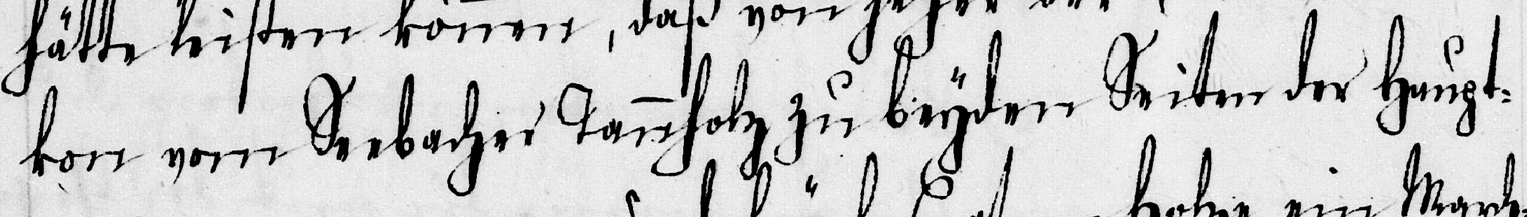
kon vom Seebacher Tannholz zu beyden Seiten der Haupt¬
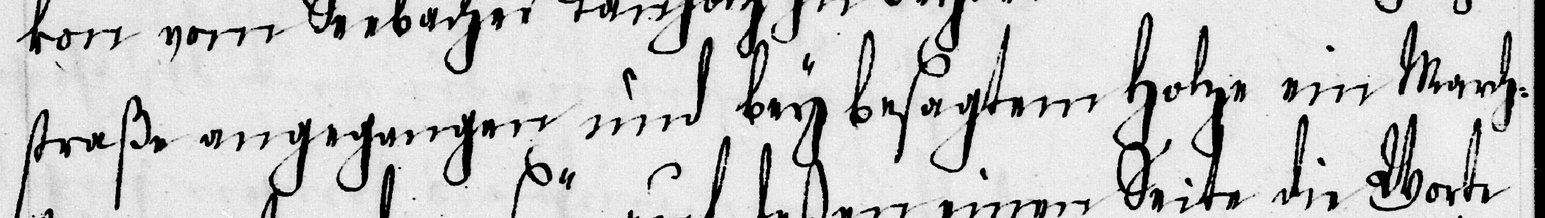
straße angegangen und bey besagtem Holze ein March¬
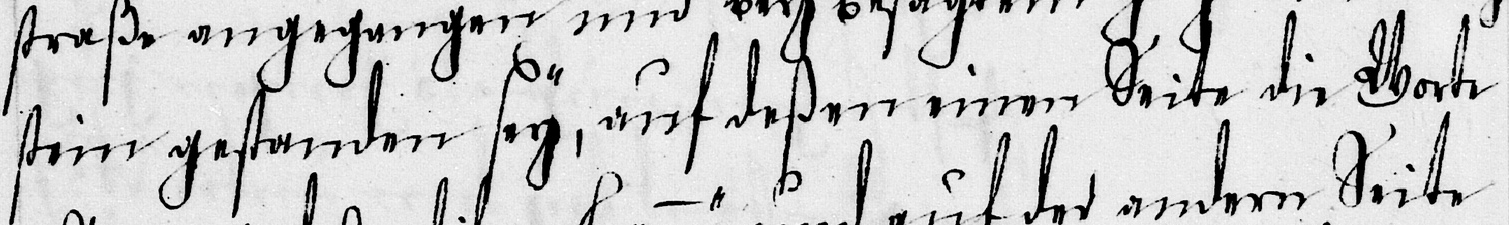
stein gestanden sey, auf deßen einen Seite die Worte
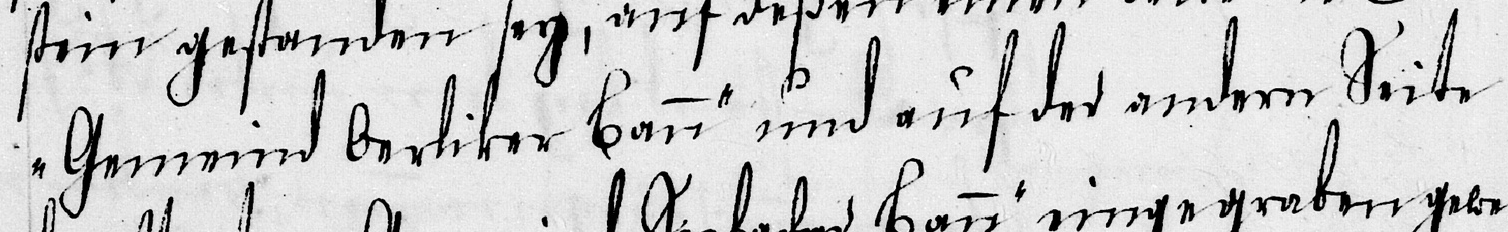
„Gemeind Oerliker Bann“ und auf der andern Seite
